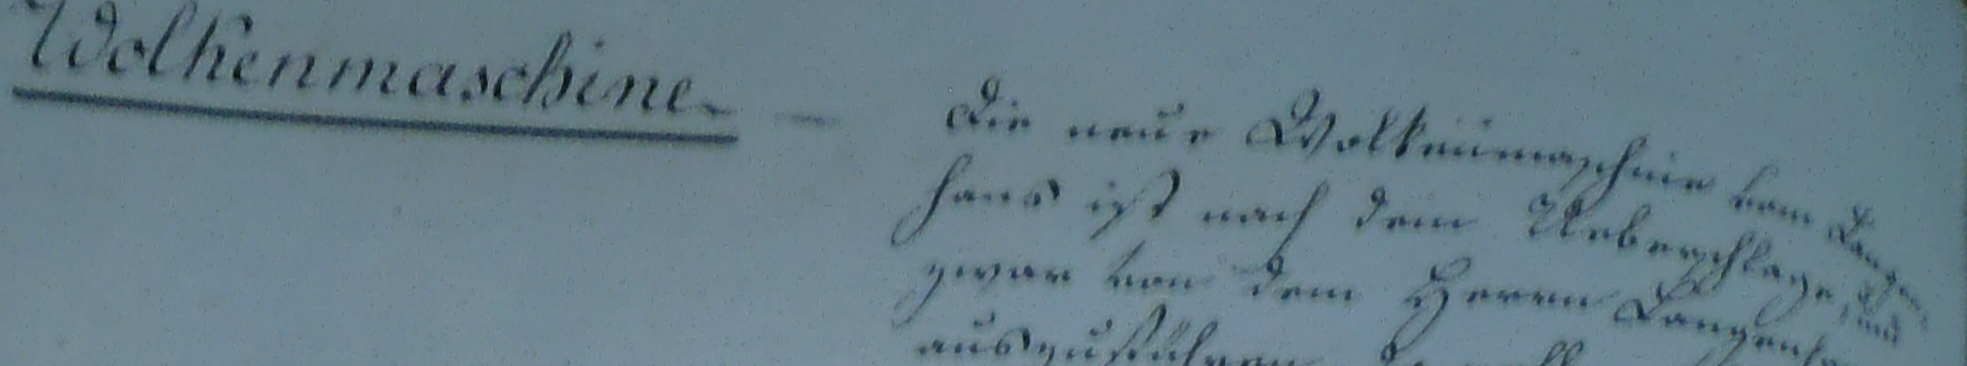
Wolkenmaschine _ Die neue Wolkenmaschine von Langen¬
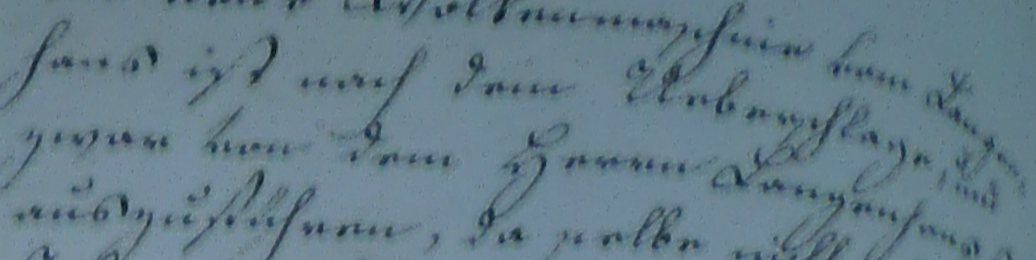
hans ist nach dem Ueberschlage, und
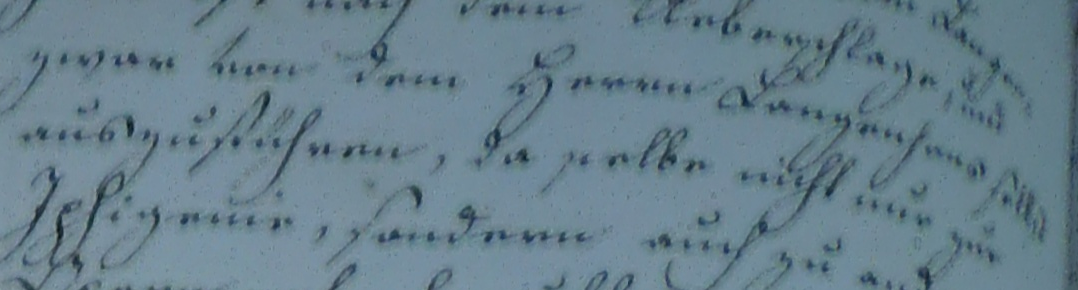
zwar von dem Herrn Langenhans Falles
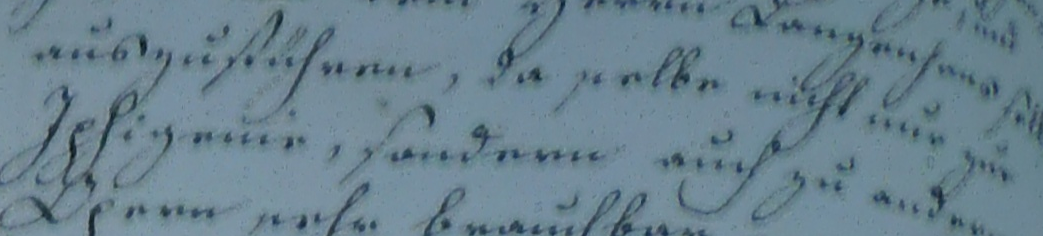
auszuführen, da selbe nicht nur zur
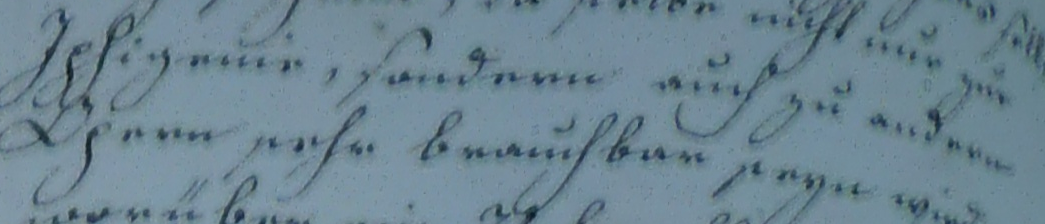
Iphigenie, sondern auch zu andern
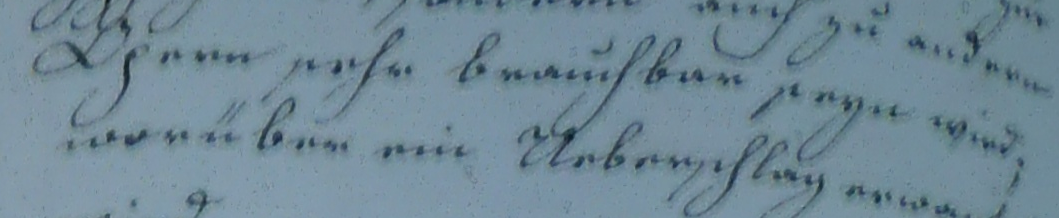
Opern sehr brauchbar seyn wird;
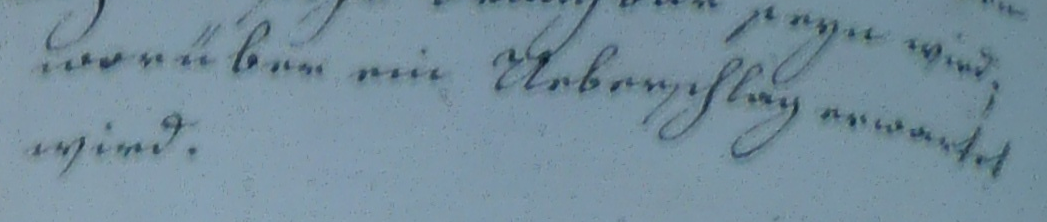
worüber ein Ueberschlag erwartet
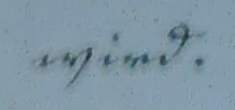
wird.
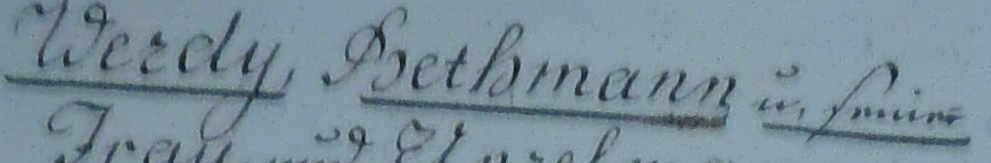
Werdy, Bethmann u. seiner
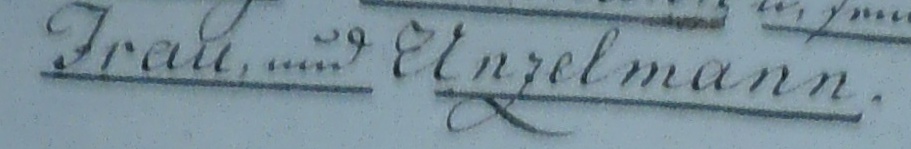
Frau, und Unzelmann.
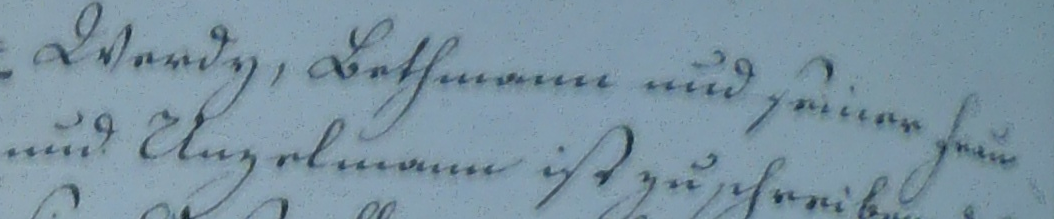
Werdy, Bethmann und seiner Frau
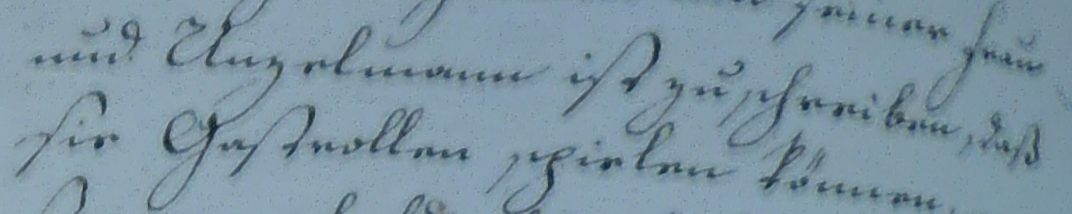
und Unzelmann ist zu schreiben, daß
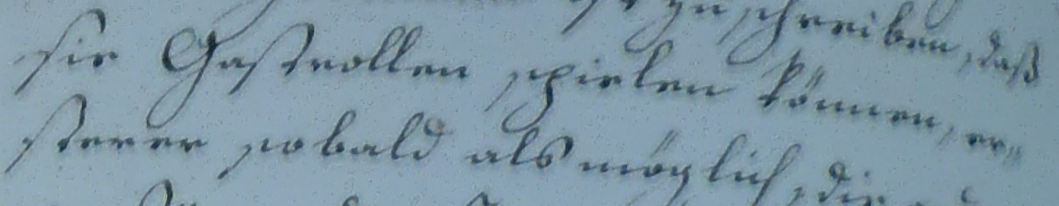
sie Gastrollen spielen können, er¬
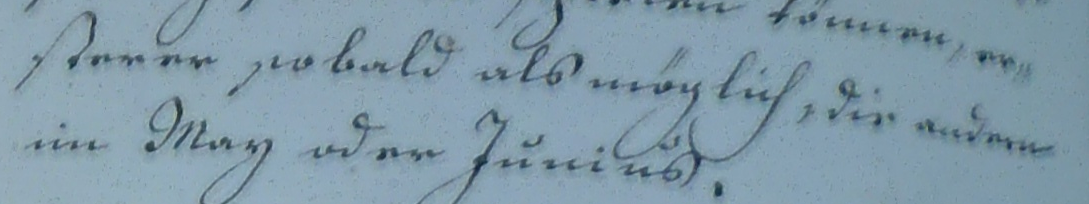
sterer sobald als möglich, die andern
